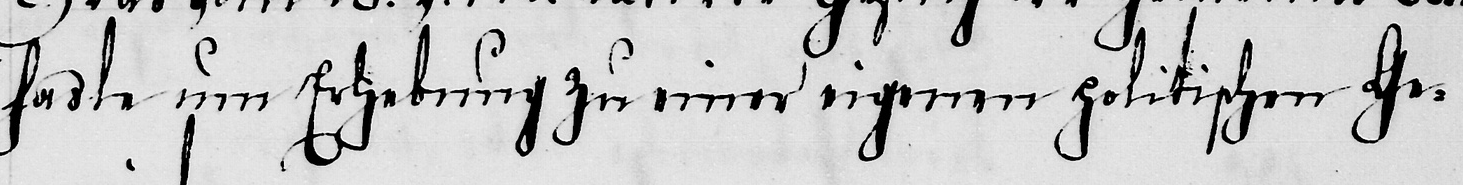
hasle um Erhebung zu einer eigenen politischen Ge¬
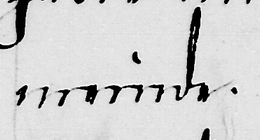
meinde.
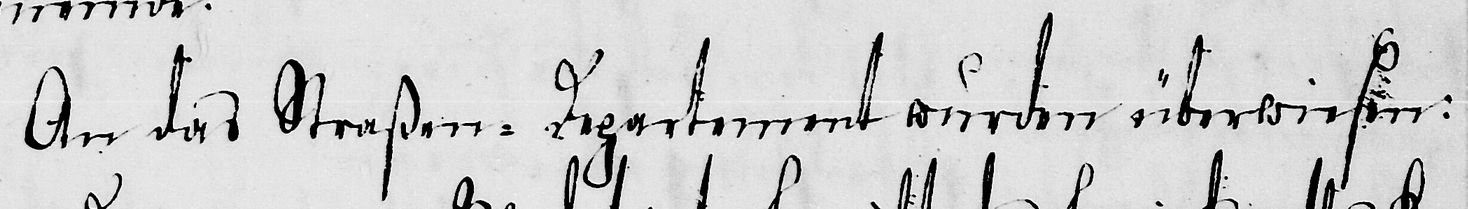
An das Straßen-Departement wurden überwiesen:
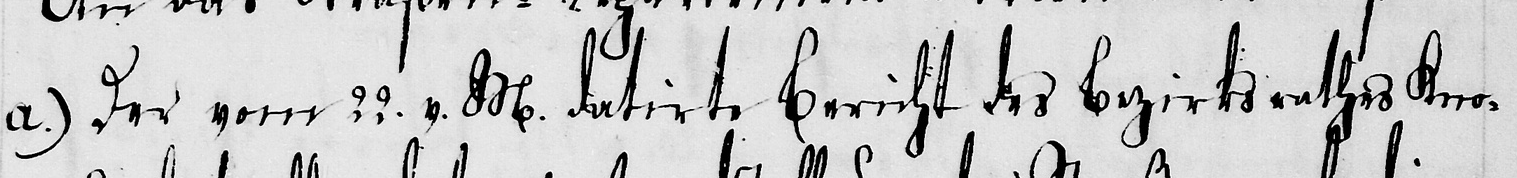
a.) Der vom 22. v. M. datirte Bericht des Bezirksrathes Kno¬
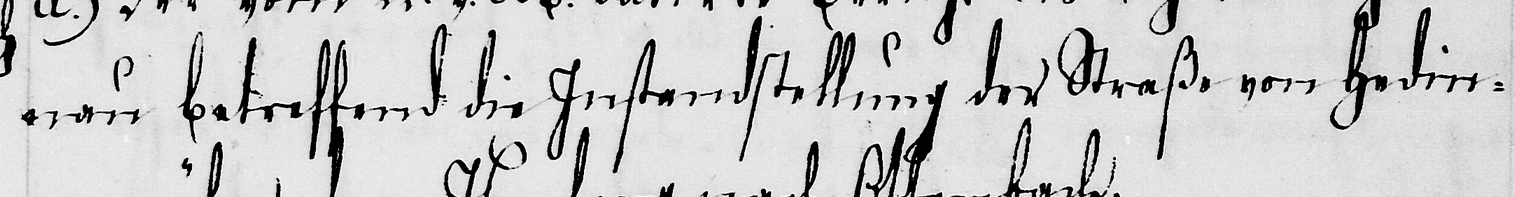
nau betreffend die Instandstellung der Straße von Hedin¬
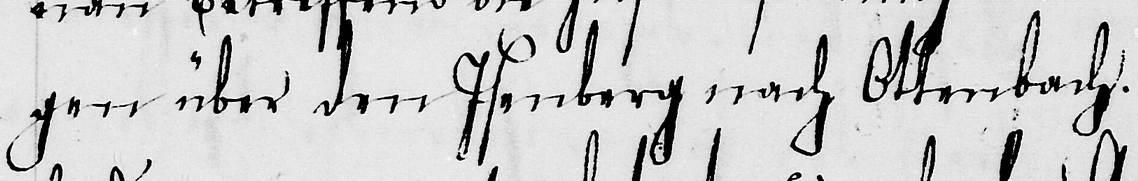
gen über den Isenberg nach Ottenbach.
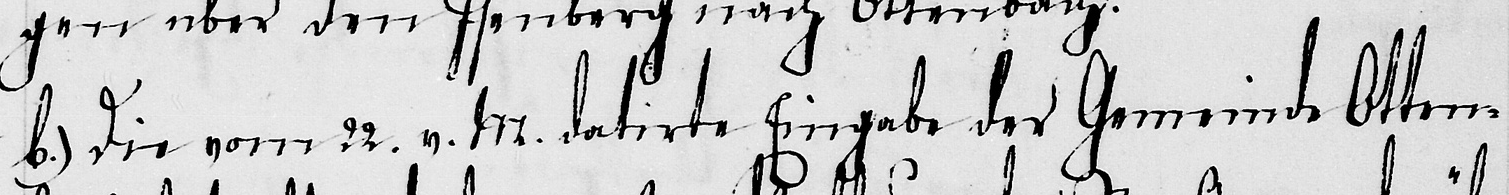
b.) Die vom 22. v. M. datirte Eingabe der Gemeinde Otten¬
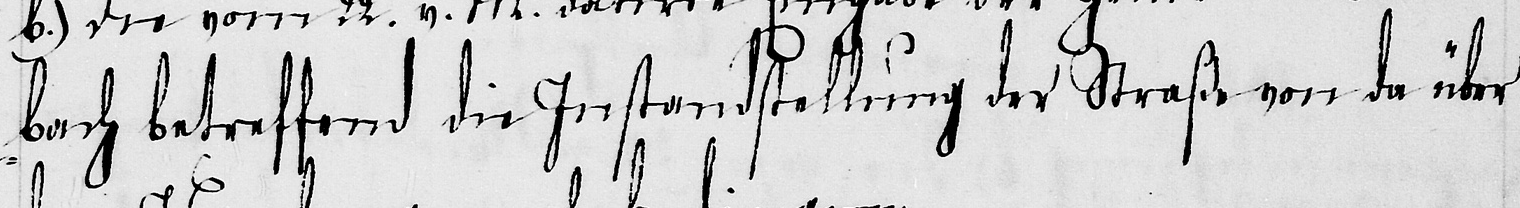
bach betreffend die Instandstellung der Straße von da über
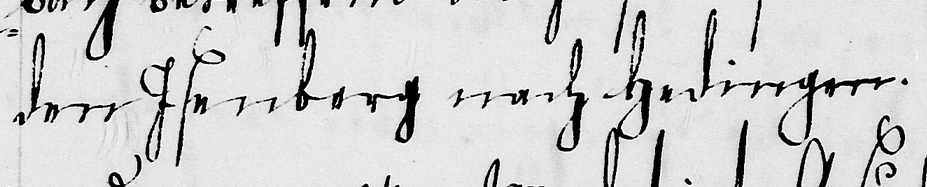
den Isenberg nach Hedingen.
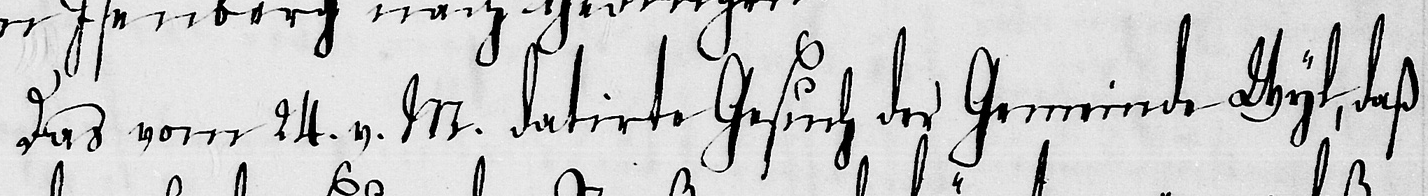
Das vom 24. v. M. datirte Gesuch der Gemeinde Wyl, daß
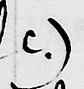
c.)
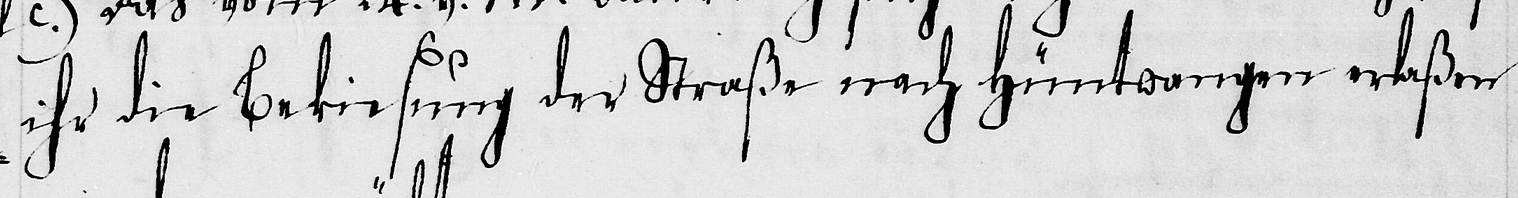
ihr die Bekiesung der Straße nach Hüntwangen erlaßen
